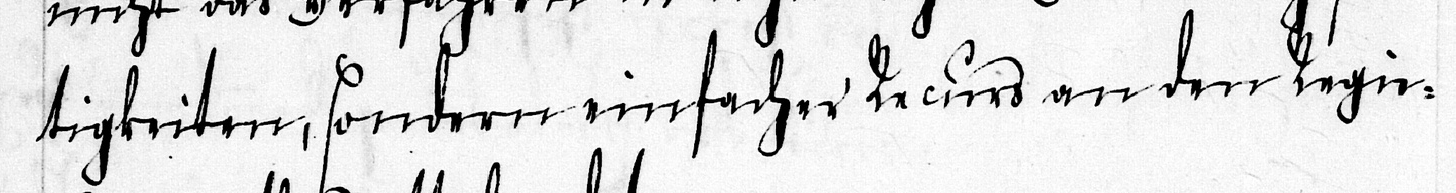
tigkeiten, sondern einfacher Recurs an den Regie¬
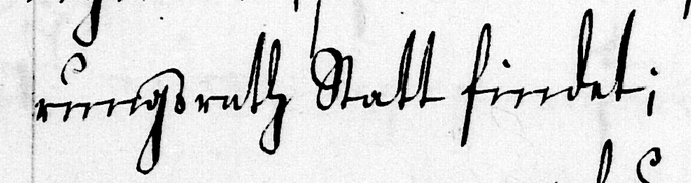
rungsrath Statt findet;
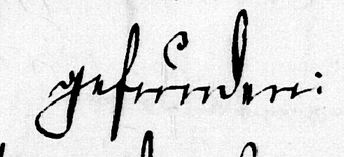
gefunden:
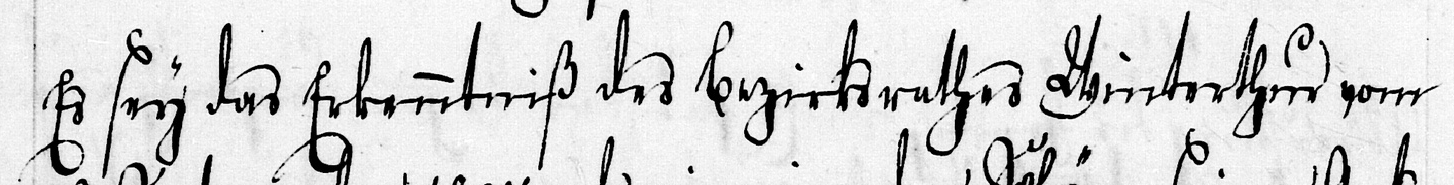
Es sey das Erkenntniß des Bezirksrathes Winterthur vom
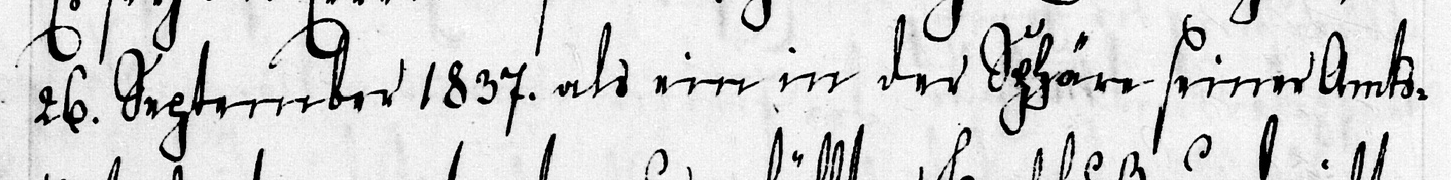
26. September 1837. als ein in der Sphäre seiner Amts¬
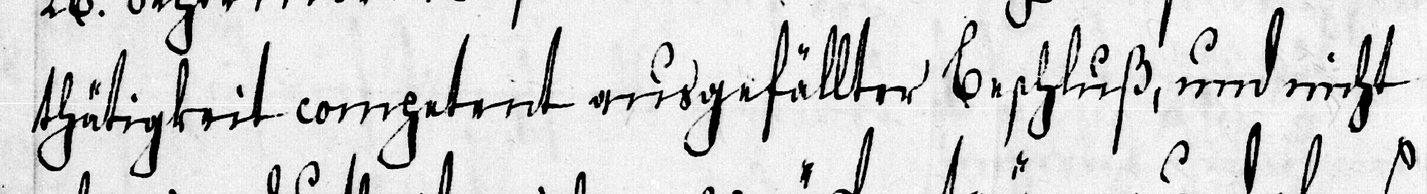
thätigkeit competent ausgefällter Beschluß, und nicht
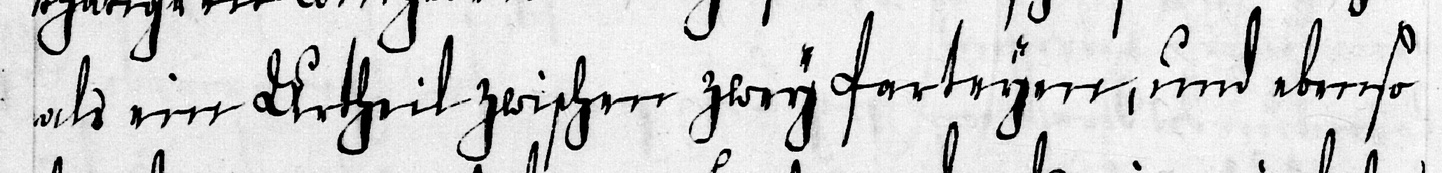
als ein Urtheil zwischen zwey Parteyen, und ebenso
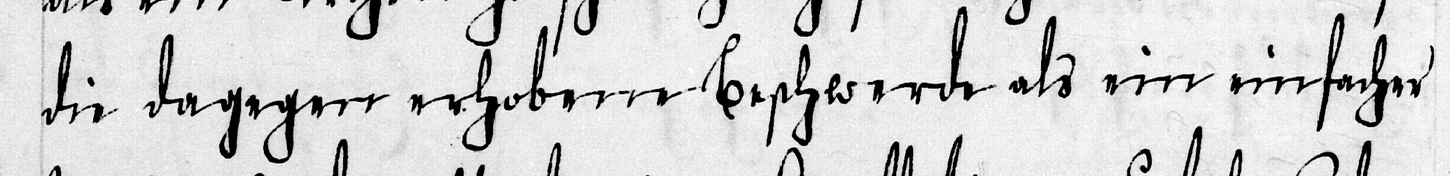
die dagegen erhobene Beschwerde als ein einfacher
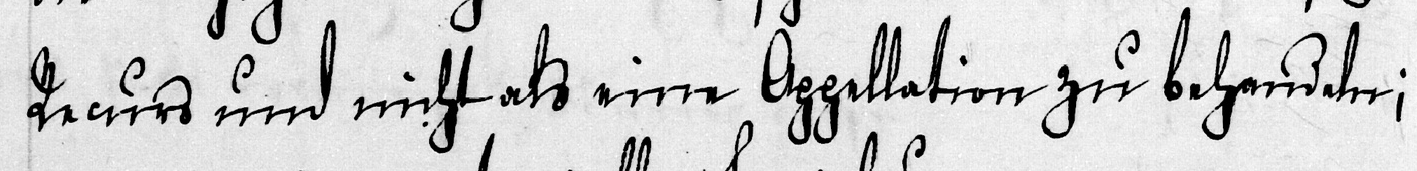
Recurs und nicht als eine Appellation zu behandeln;
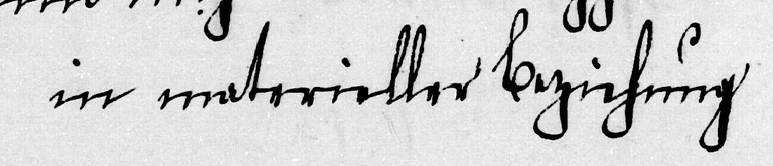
in materieller Beziehung
